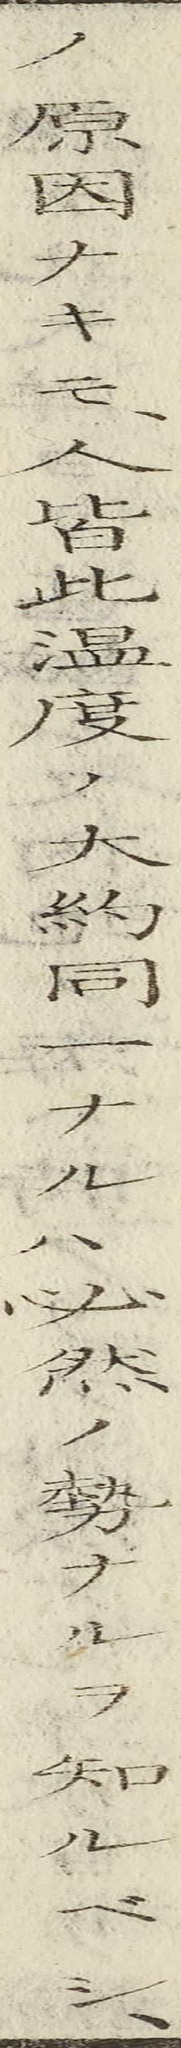ノ原因ナキモ、人皆此温度ノ大約同一ナルハ必然ノ勢ナルヲ知ルベシ、
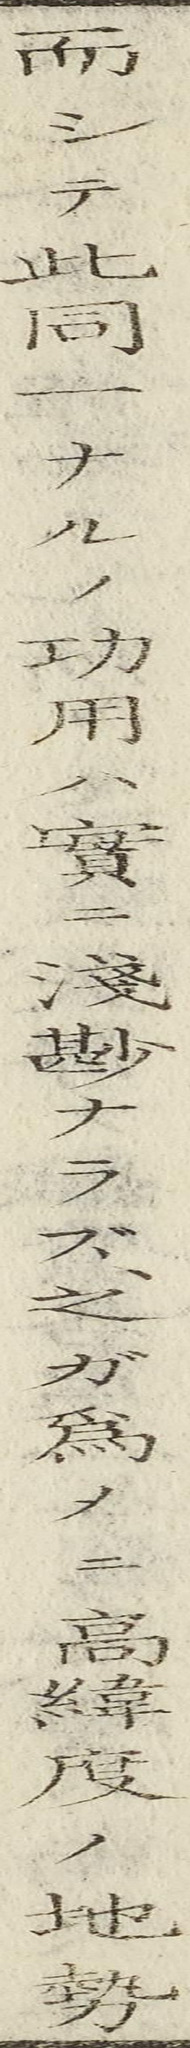而シテ此同一ナルノ功用ハ実ニ浅尠ナラズ、之ガ為メニ高緯度ノ地勢
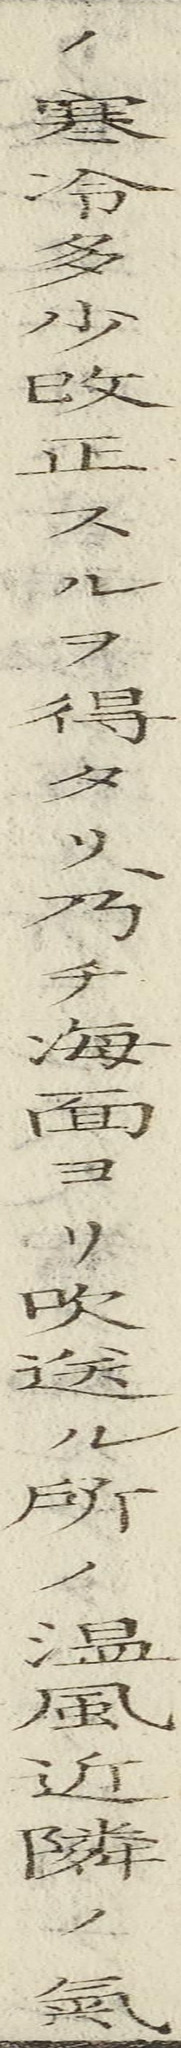ノ寒冷多少改正スルヲ得タリ、乃チ海面ヨリ吹送ル所ノ温風近隣ノ気
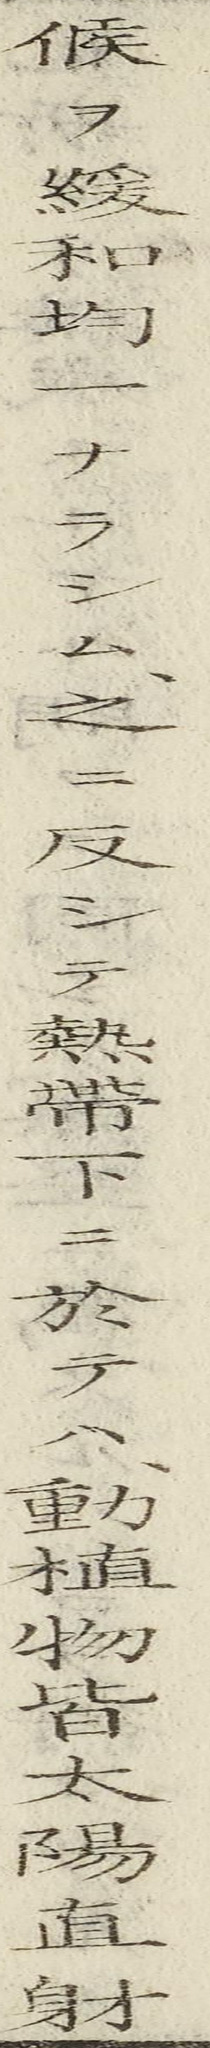候ヲ緩和均一ナラシム、之ニ反シテ熱帯下ニ於テハ、動植物皆太陽直射
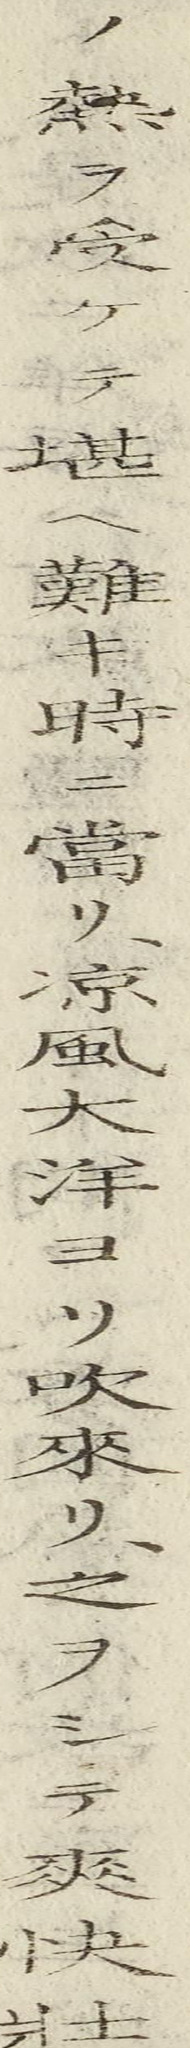ノ熱ヲ受ケテ堪ヘ難キ時ニ当リ、涼風大洋ヨリ吹来リ、之ヲシテ爽快壮
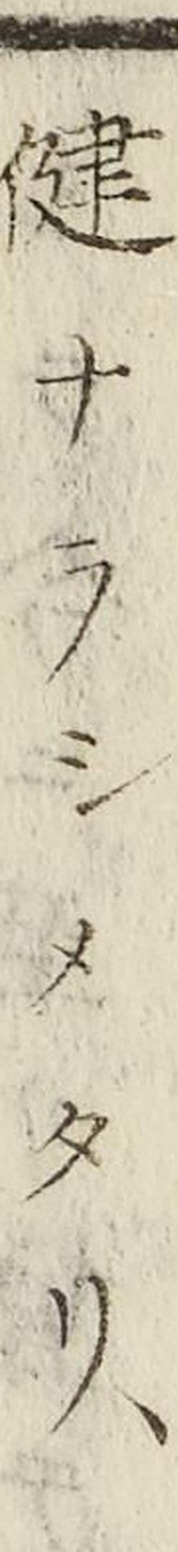健ナラシメタリ、
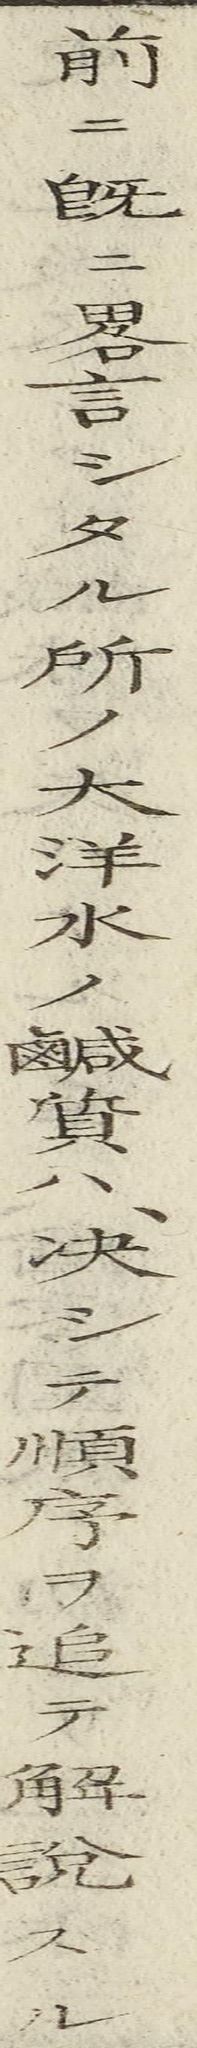前ニ既ニ略言シタル所ノ大洋水ノ鹹質ハ、決シテ順序ヲ追テ解説スル
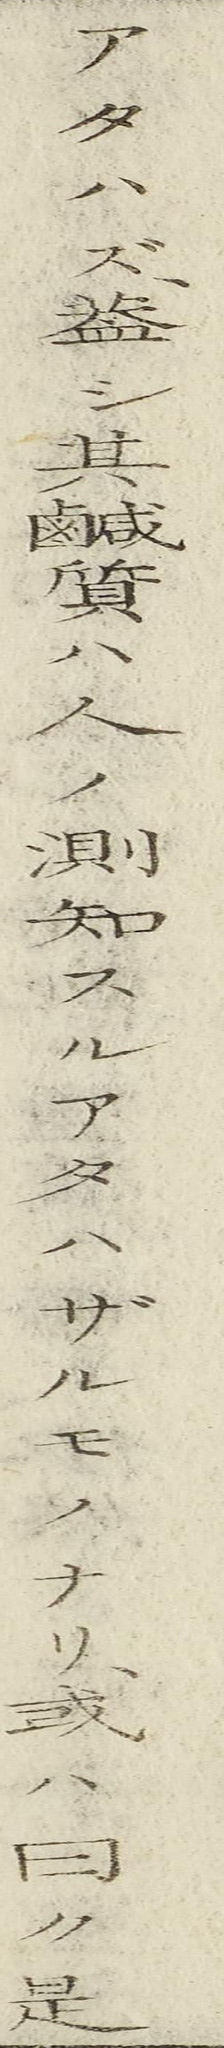アタハズ、蓋シ其鹹質ハ人ノ測知スルアタハザルモノナリ、或ハ曰ク是
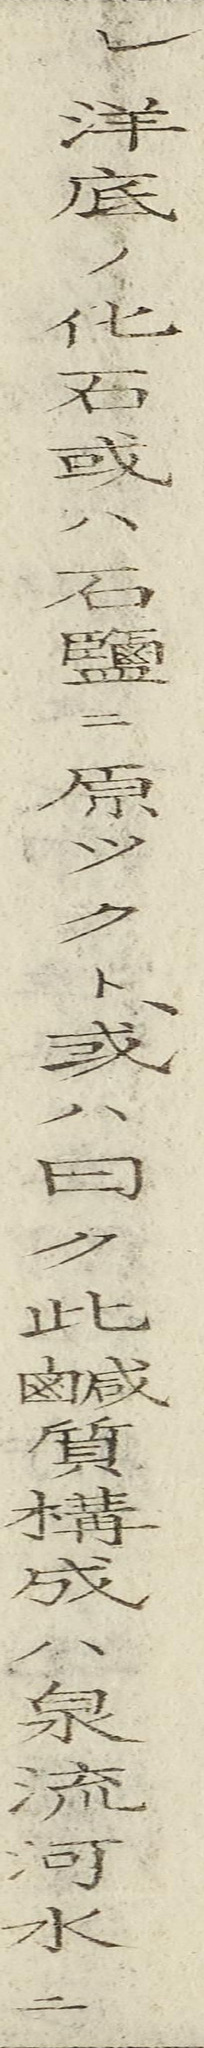レ洋底ノ化石或ハ石塩ニ原ツクト、或ハ曰ク此鹹質構成ハ泉流河水ニ
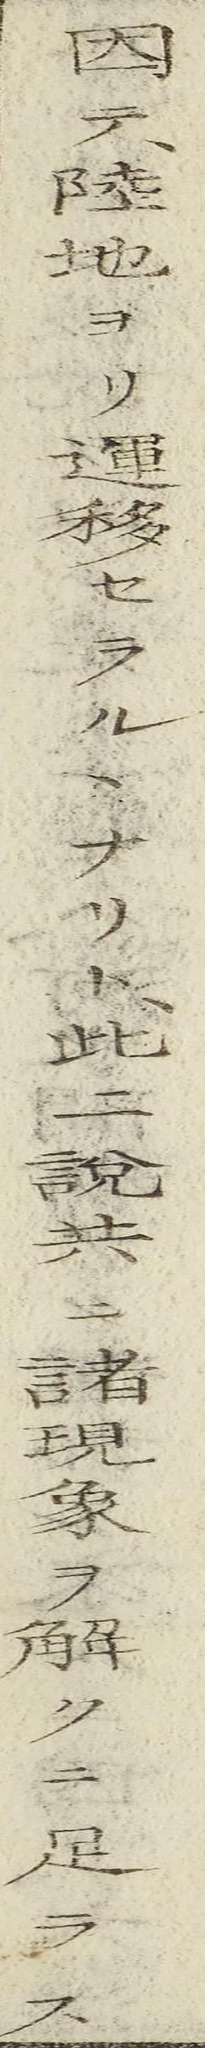因テ、陸地ヨリ運移セラルヽナリト、此ニ説共ニ諸現象ヲ解クニ足ラス

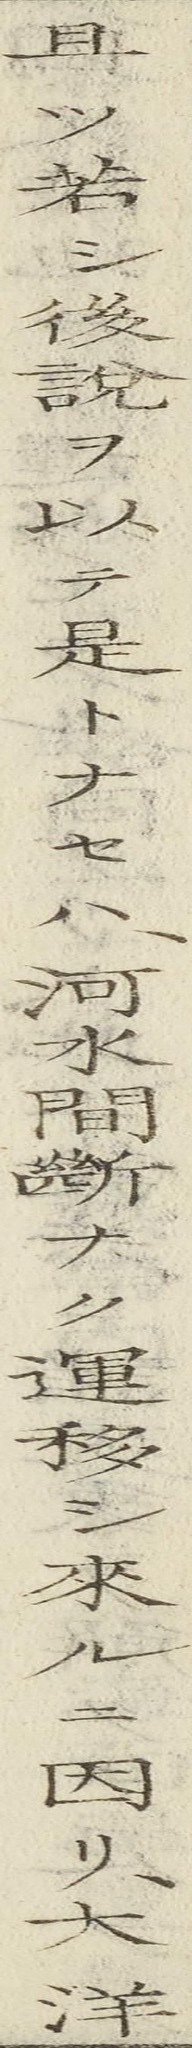且ツ若シ後説ヲ以テ是トナセハ、河水間断ナク運移シ来ルニ因リ、大洋
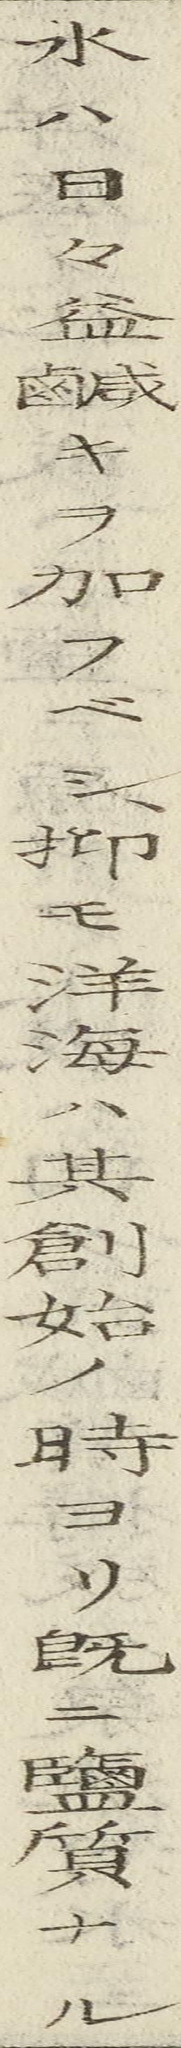水ハ日々益鹹キヲ加フベシ、抑モ洋海ハ其創始ノ時ヨリ既ニ塩質ナル
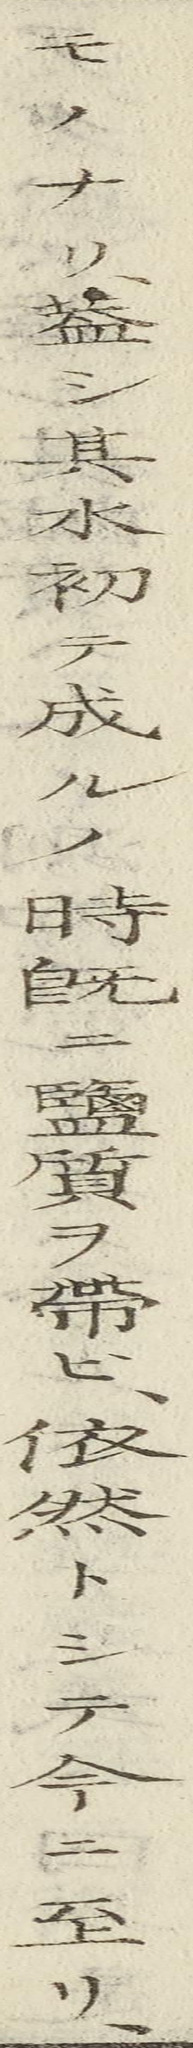モノナリ、蓋シ其水初テ成ルノ時既ニ塩質ヲ帯ビ、依然トシテ今ニ至リ、
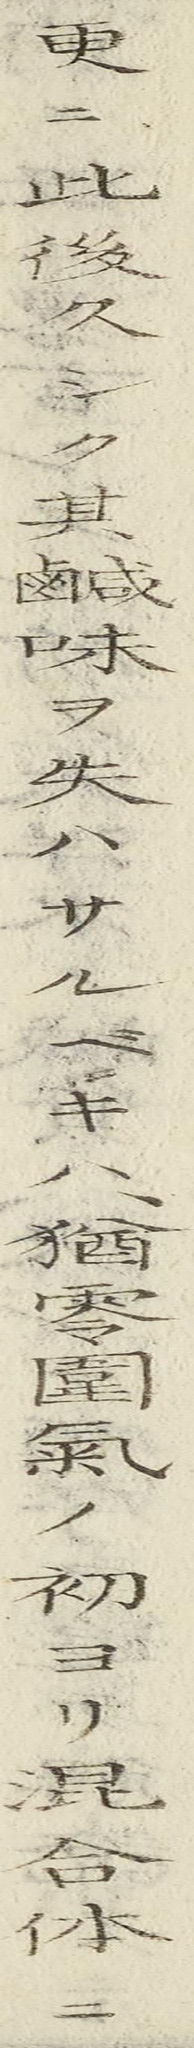更ニ此後久シク其鹹味ヲ失ハサルベキハ、猶雰囲気ノ初ヨリ混合体ニ
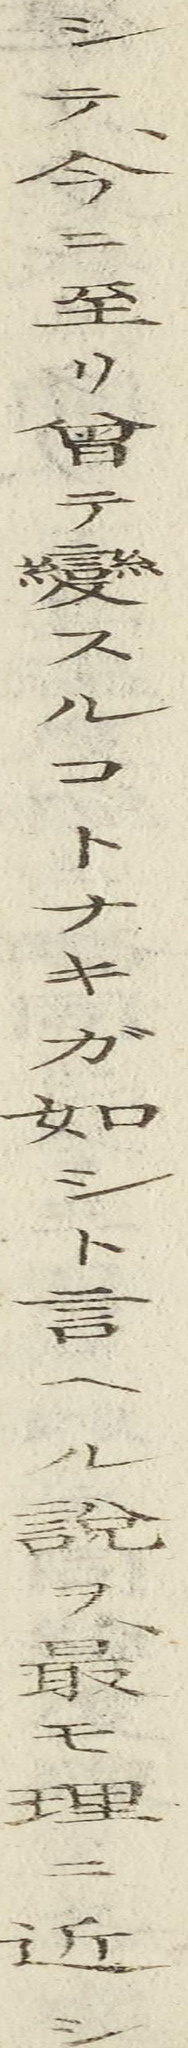シテ、今ニ至リ嘗テ変スルコトナキガ如シト言ヘル説ヲ、最モ理ニ近シ
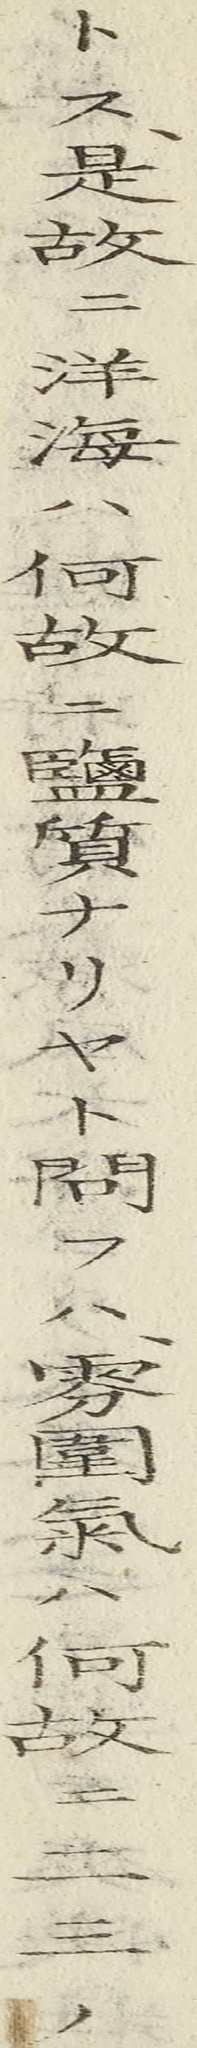トス、是故ニ洋海ハ何故ニ塩質ナリヤト問フハ、雰囲気ハ何故ニ二三ノ
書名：百科全書　地文學　全
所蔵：東京大学地震研究所図書室 Earthquake Research Institute Library, The University of Tokyo, JAPAN
